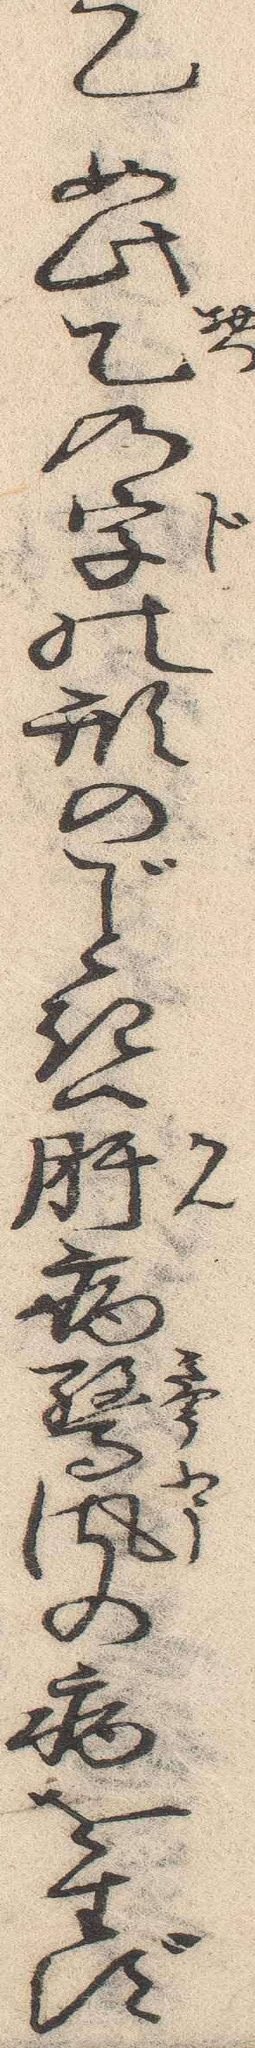如此乙の字の形のごときは肝病驚風の病を生ず
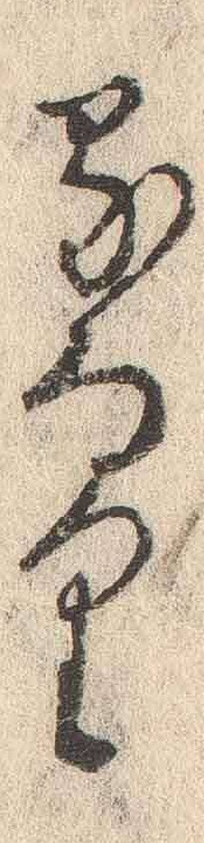るなり
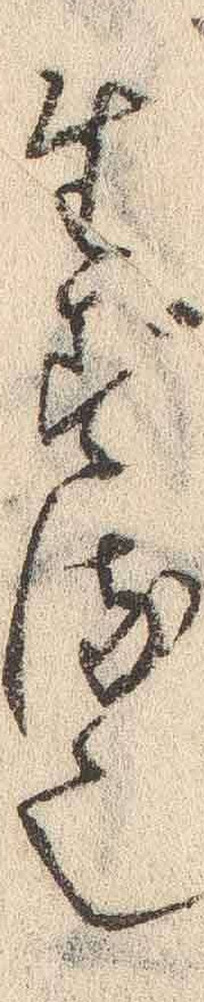生ずる也
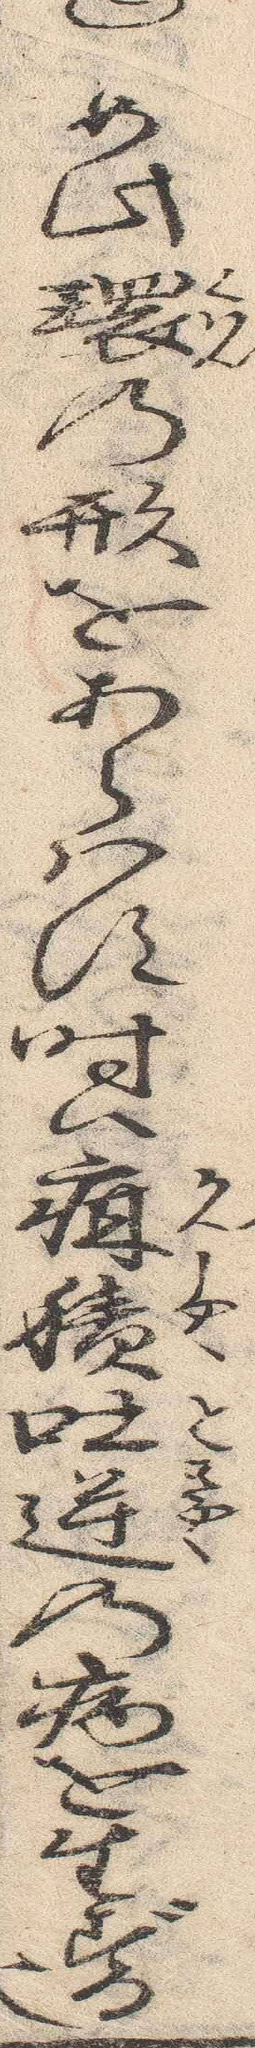如此環の形をあらはす時は疳積吐逆の病を生ずる也
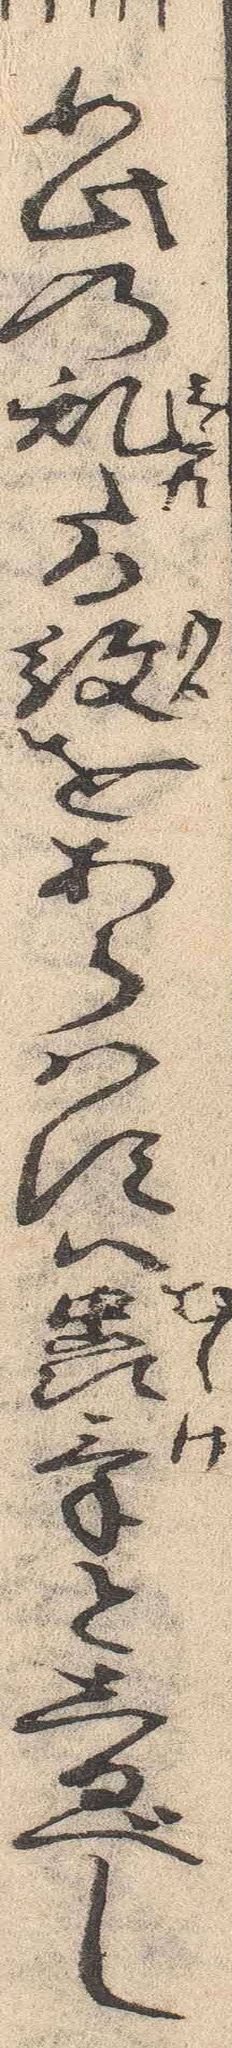如此の乱たる紋をあらはすは蟲氣としるべし
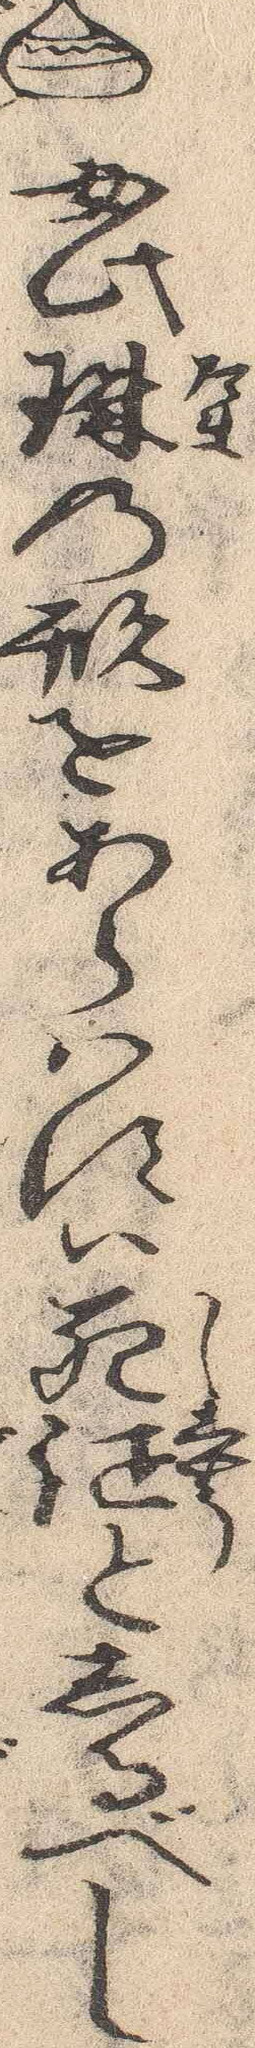如此珠の形をあらはすは死証としるべし
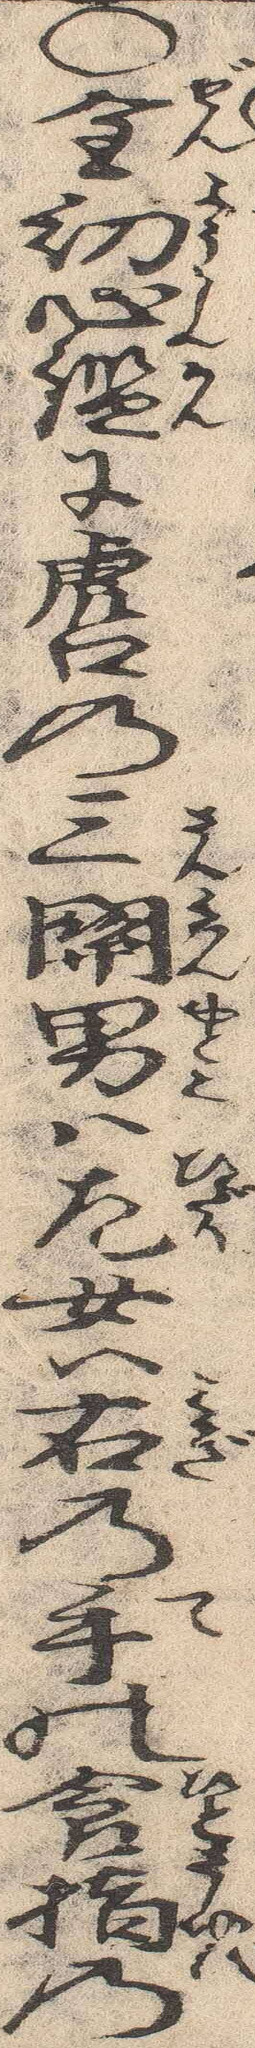◯全幼心鑑に虎口の三關男は㔫女は右の手の食指の
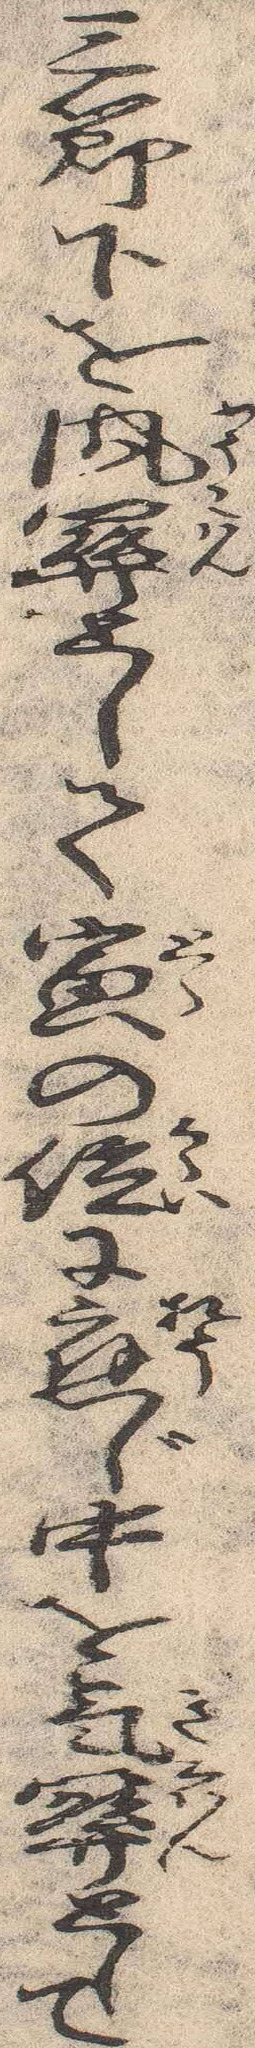三節下を風關として寅の位に應じ中を気關として
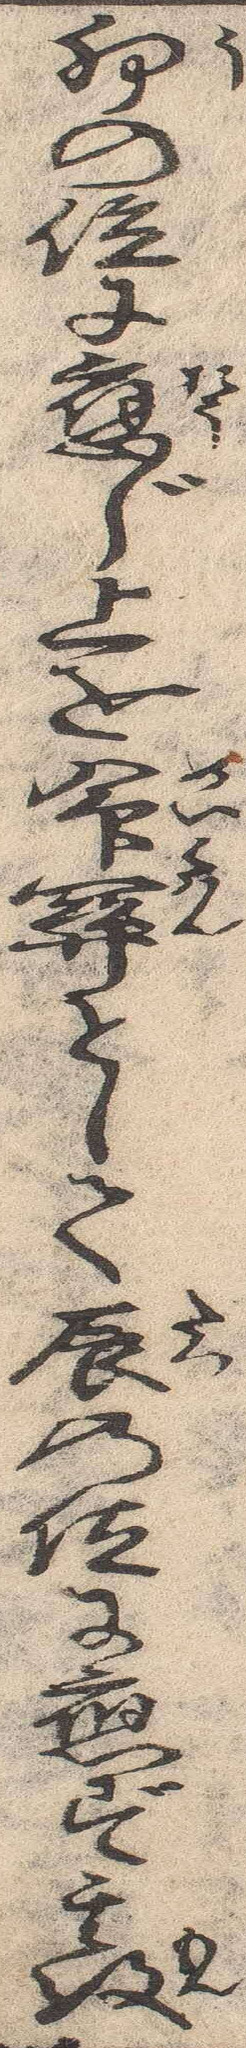卯の位に應じ上を命關として辰の位に應ず其紋
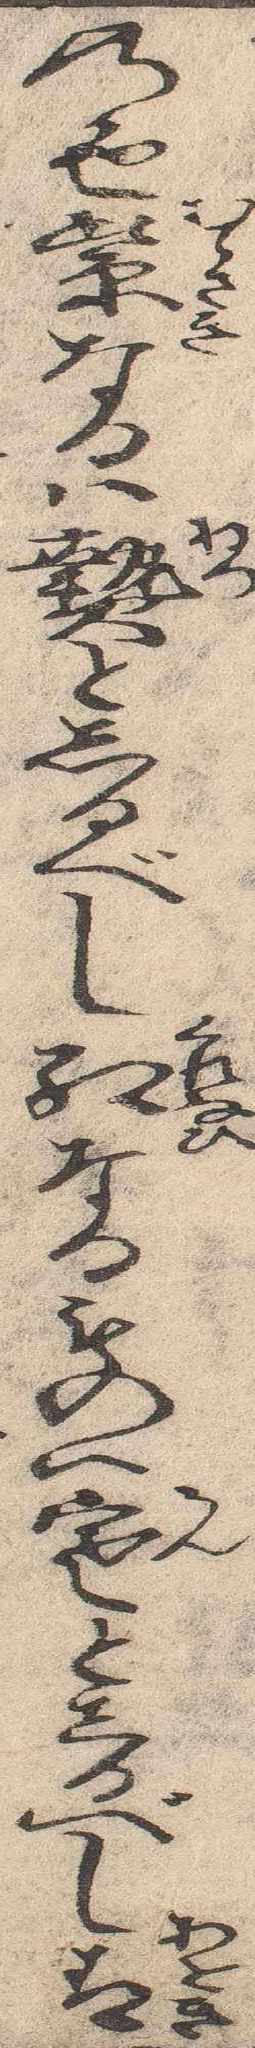の色紫なるは𤍽としるべし紅なるものは寒としるべし青
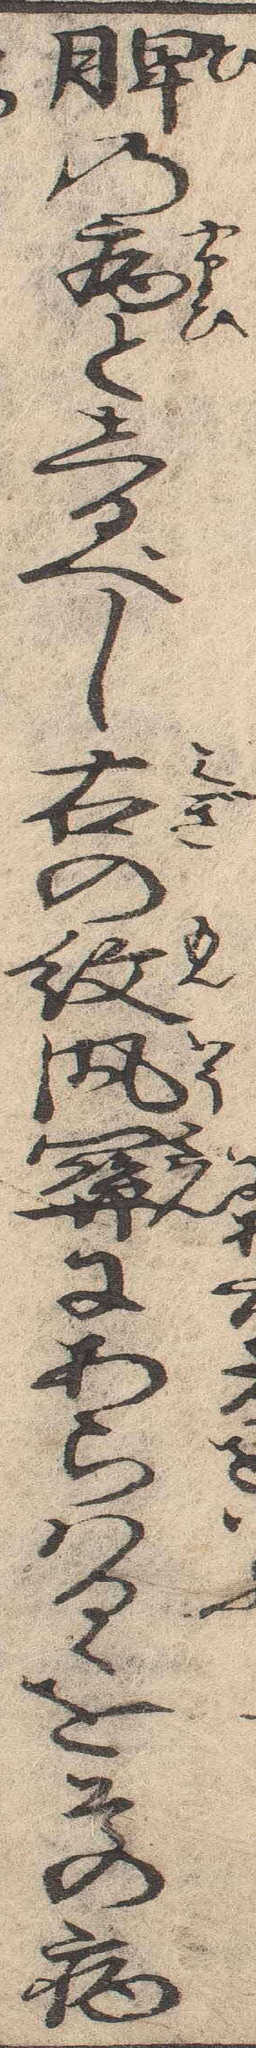脾の病としるべし右の紋風關にあらはるゝをその病
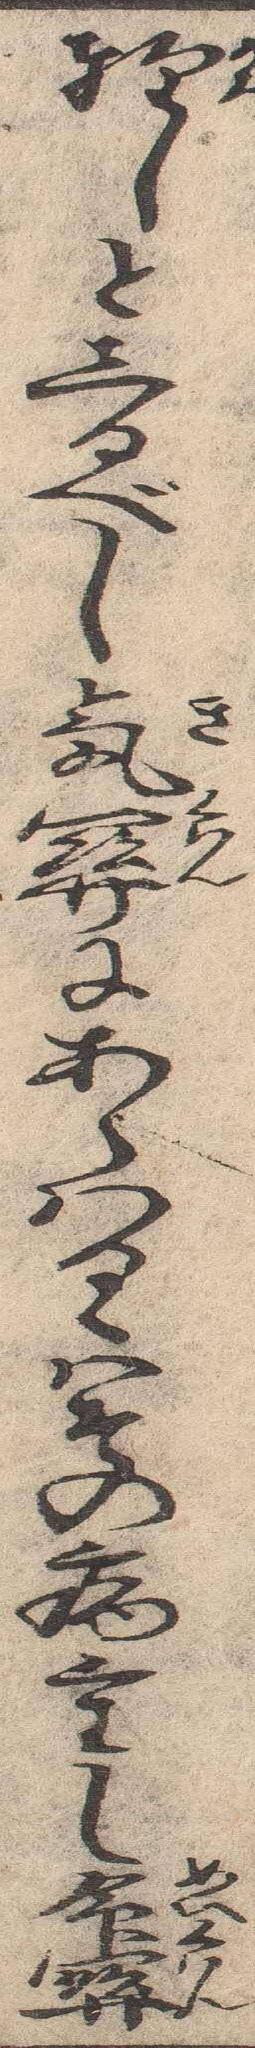軽しとしるべし気關にあらはるゝはその病重し命關
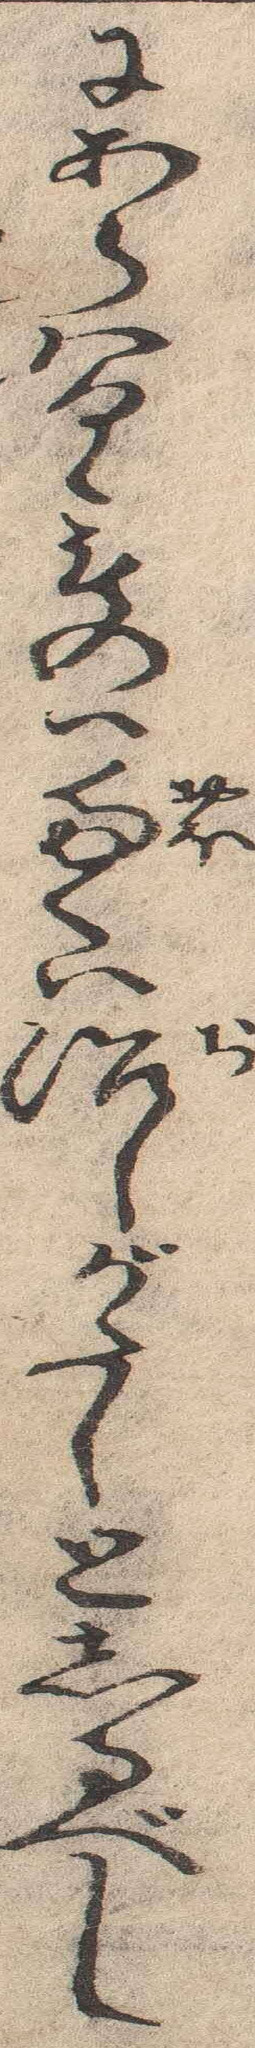にあらはるゝものは多くは治しがたしとしるべし
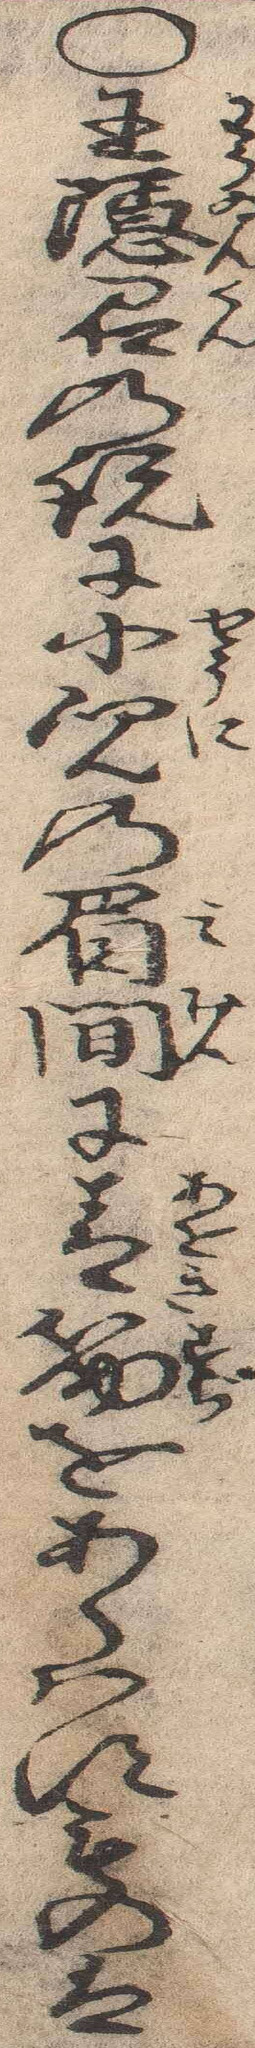◯王隠君の説に小児の眉間に青筋をあらはすものは

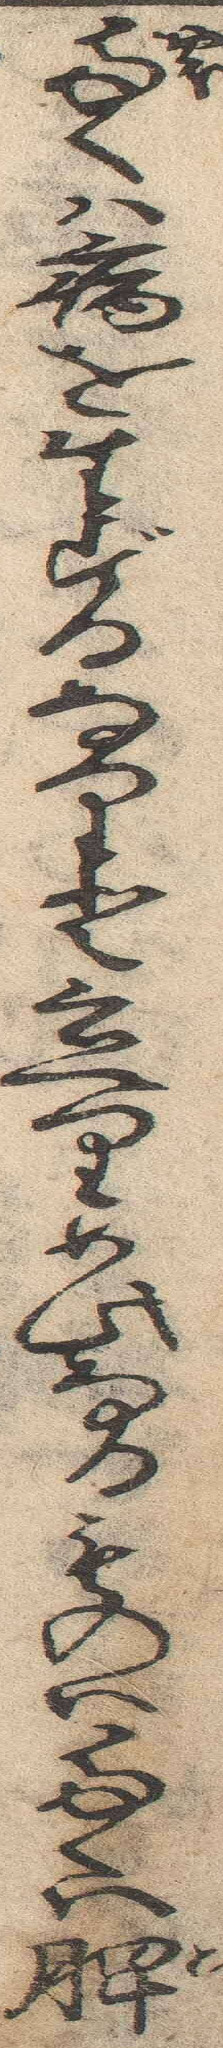多くは病を生ずるなりと云へり如此なるものは多くは脾
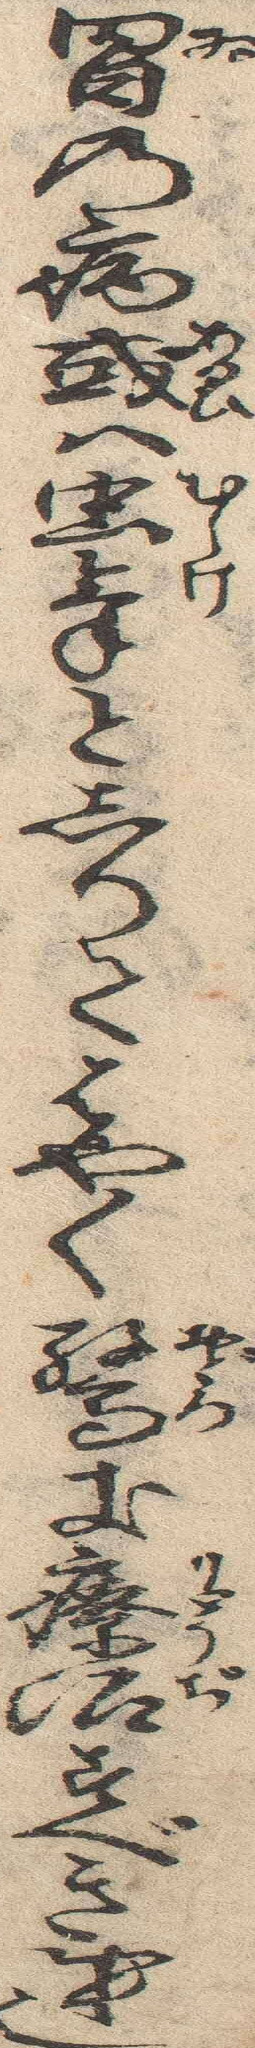胃の病或は虫氣としりてはやく驚き療治すべき事也
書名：小児必用養育草
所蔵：東京学芸大学附属図書館 国文学研究資料館
